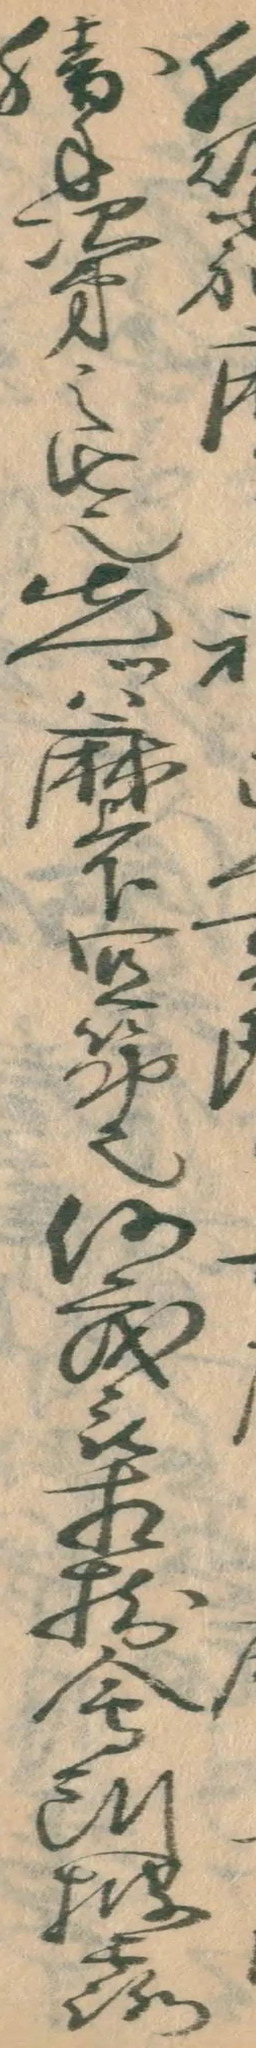勝手次第之由也先ツハ麻上下宜筋也何も被相揃会所披露
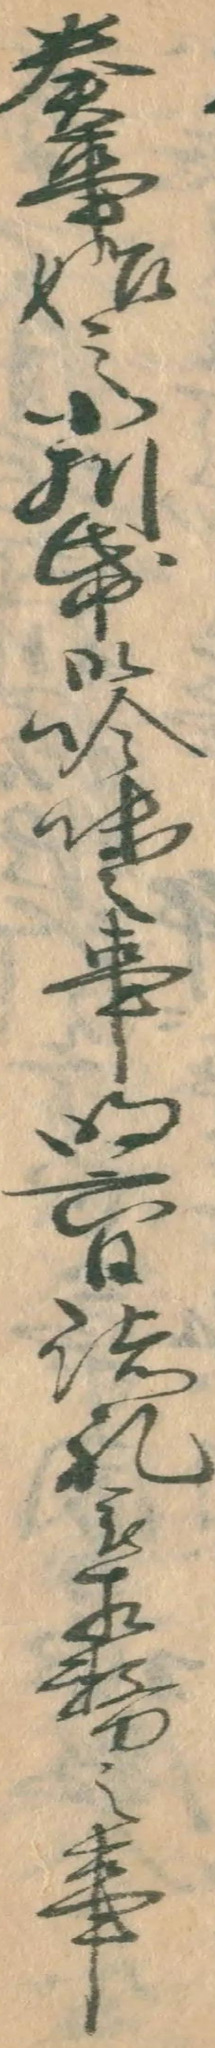奏事始之小折紙御吟味之事明六日諸礼被相務之事

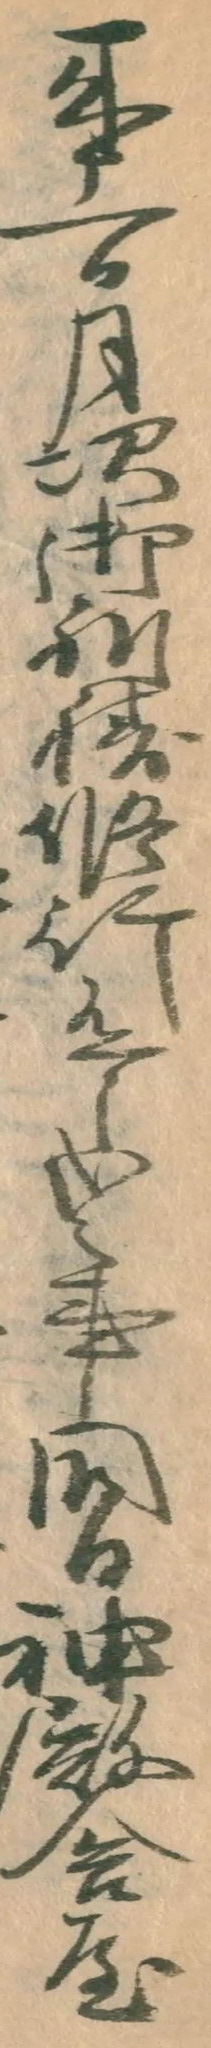来十一日月次御祈祷修行有之哉之事同日神殿舎屋
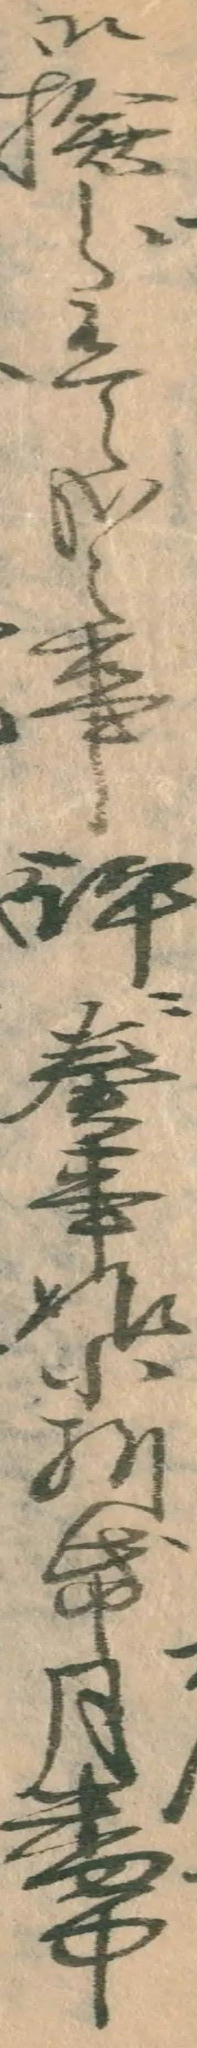御倹分有之哉之事評ニ奏事始小折紙月番中
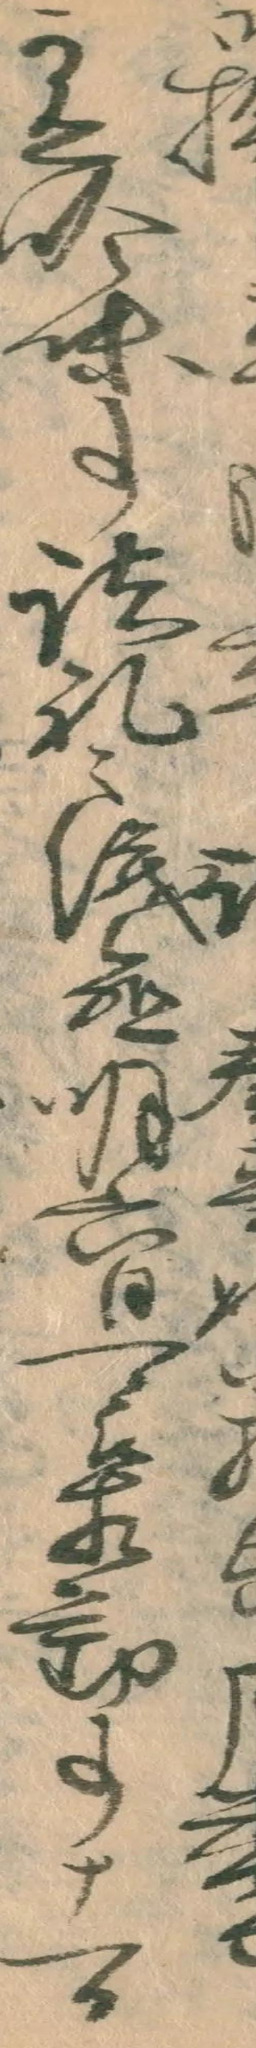可有吟味事諸礼之儀明六日可被相勤事十一日
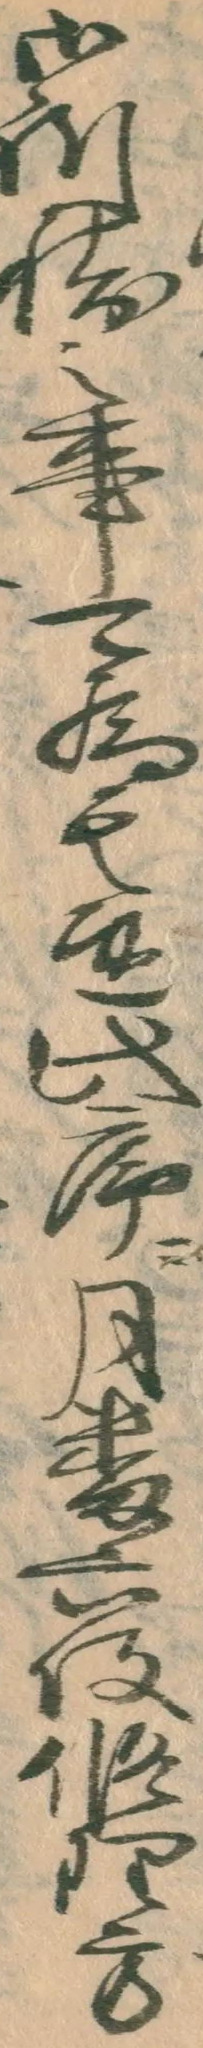御祈祷之事可為其通此序ニ月番六役修理方
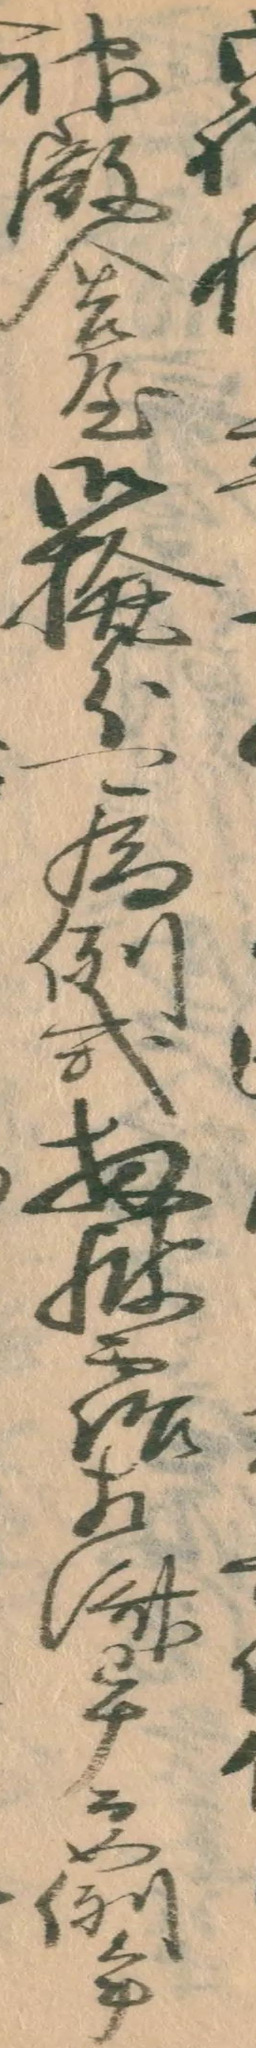神殿舎屋御検分可為例式扨披露相済畢而如例年
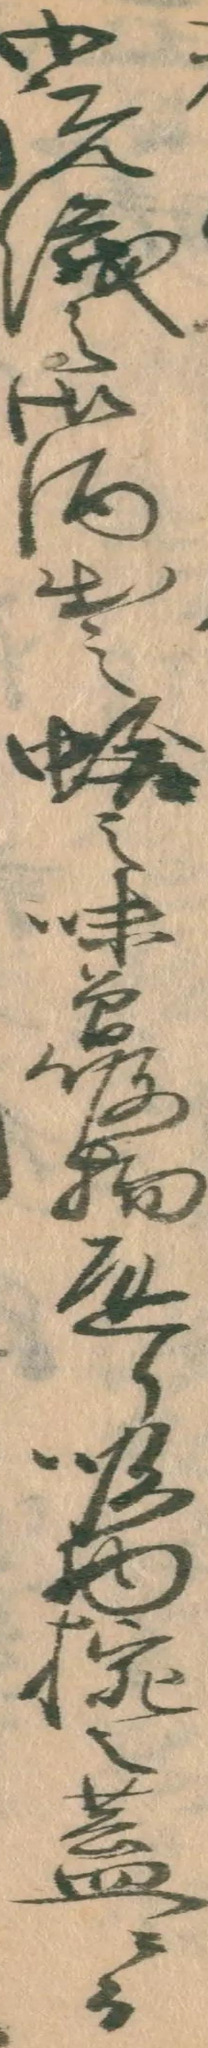御祝儀之御酒出之蛤？之味曽吸物通り吸物椀之蓋ニ而
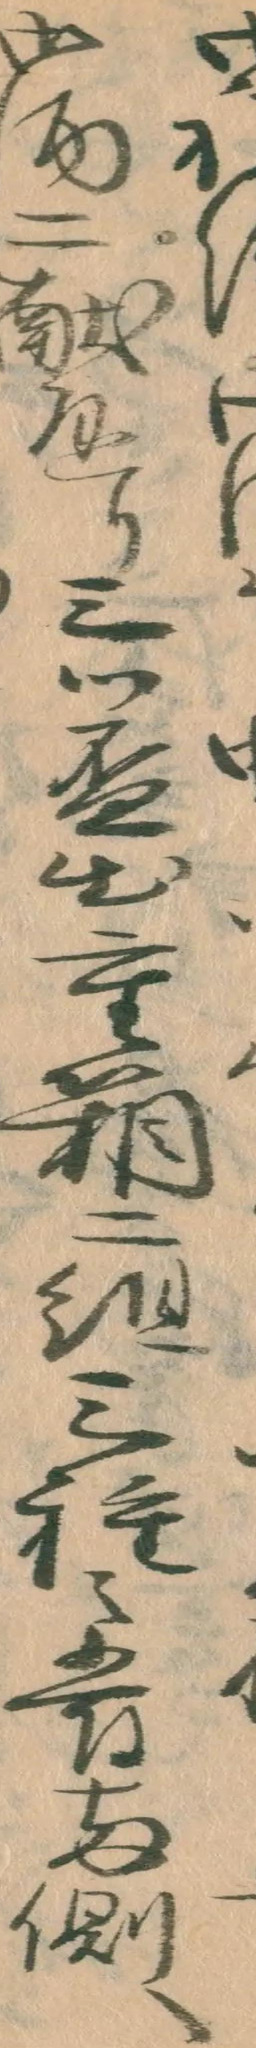御酒二献通り三ツ盃出重箱二組三種之肴両側へ
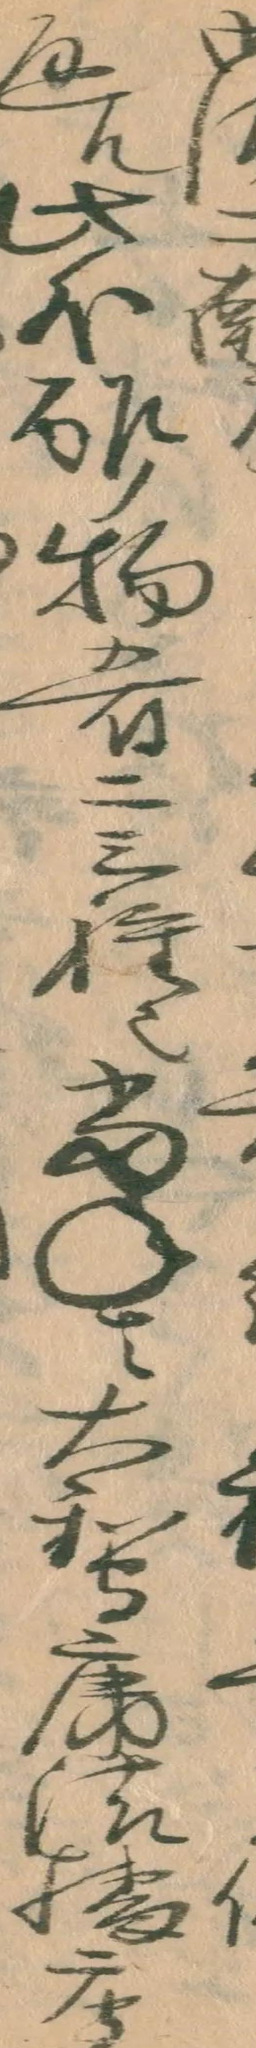通ル此外酢ノ物肴二三種也当年者大和守庸清播磨守
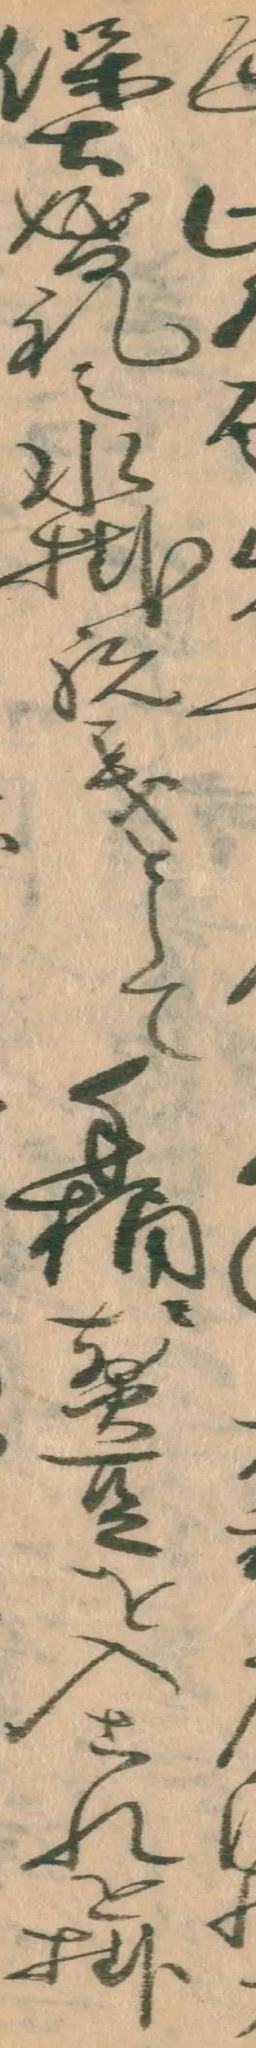保土婚礼之水掛祝義として手桶ニ煎豆を入これを掛
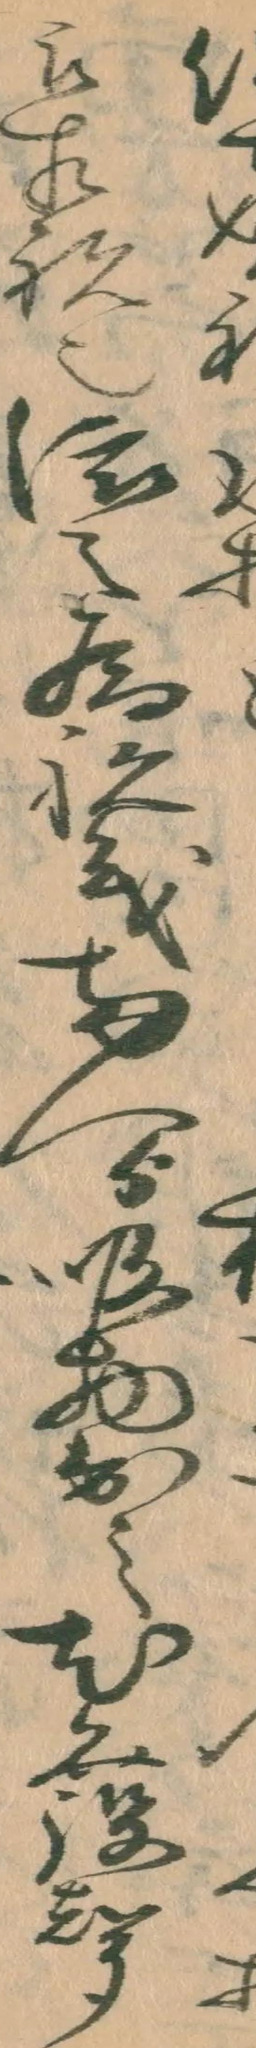被相祝也依之為祝義両人ゟ吸物致之尤役声
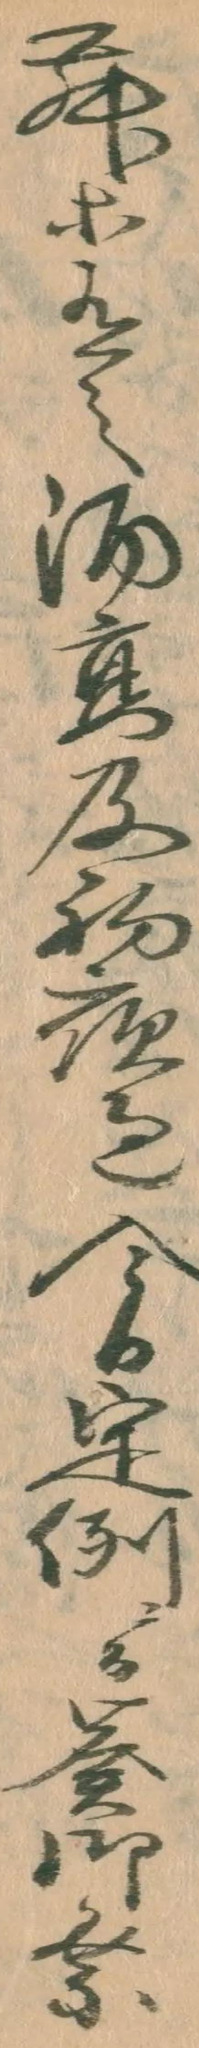舞等有之酒宴及初夜過今日定例ニ而葵御祭
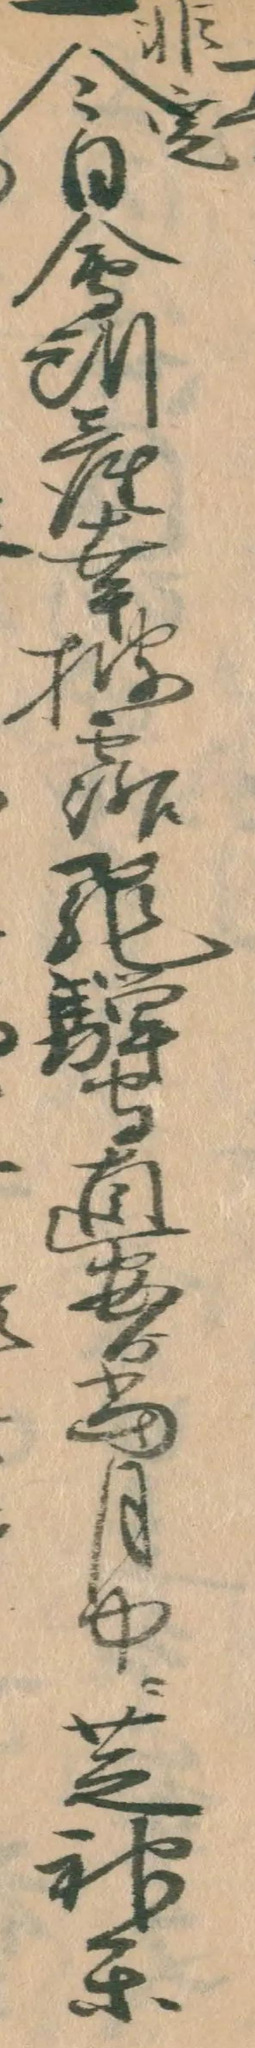一今日会所産幸披露飛騨守直安ゟ当月中ニ芝神楽
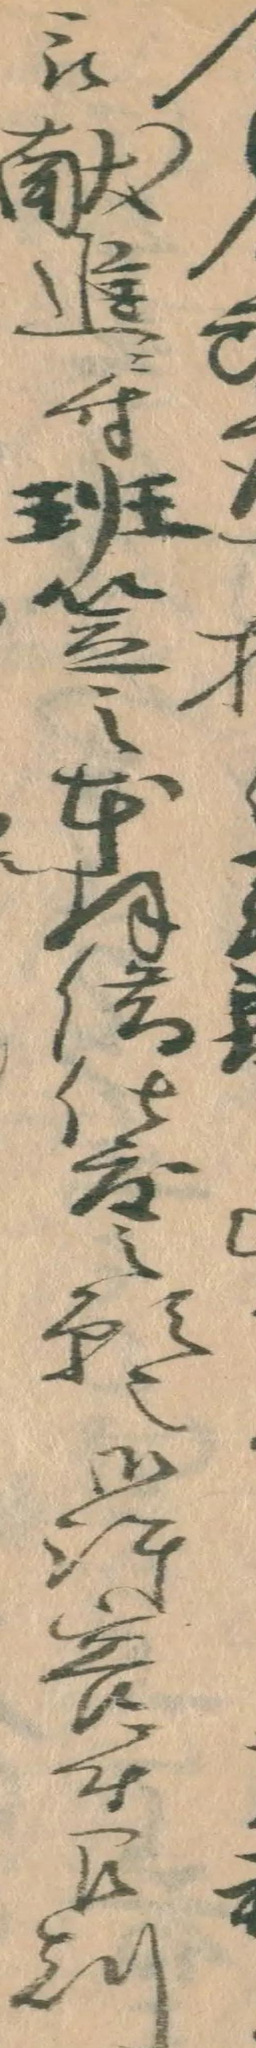被献進ニ付班笠之本拝借仕度之願也御許容ニ付即刻
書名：賀茂社記録. 第60冊
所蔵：国立国会図書館 National Diet Library, JAPAN
